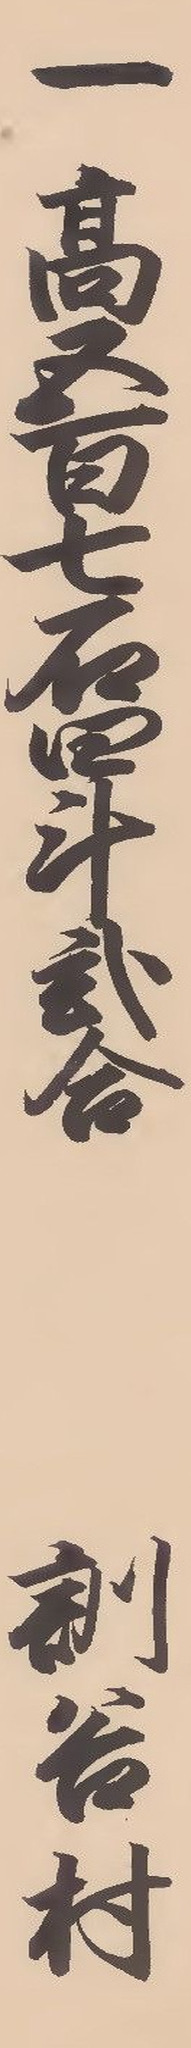一高五百七石四斗弐合割谷村
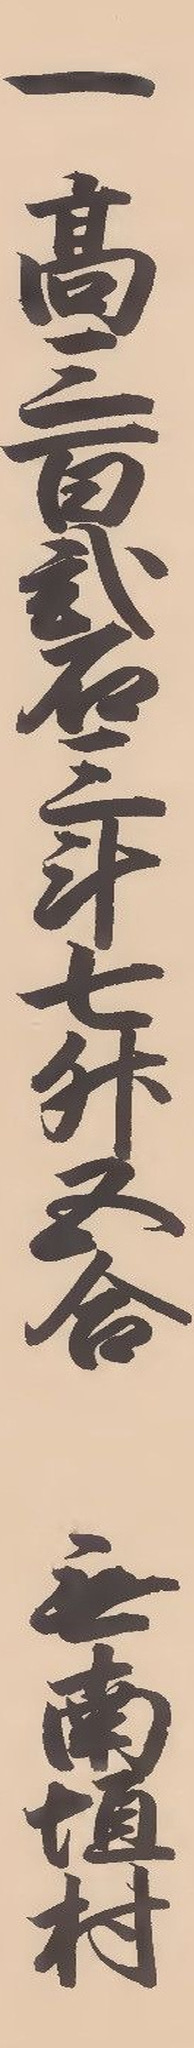一高三百弐石三斗七升五合無南垣村
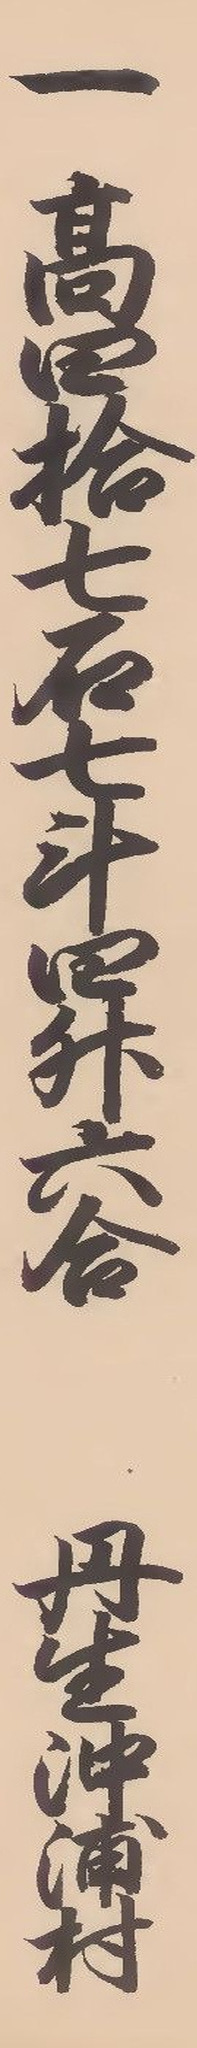一高四拾七石七斗四升六合丹生沖浦村

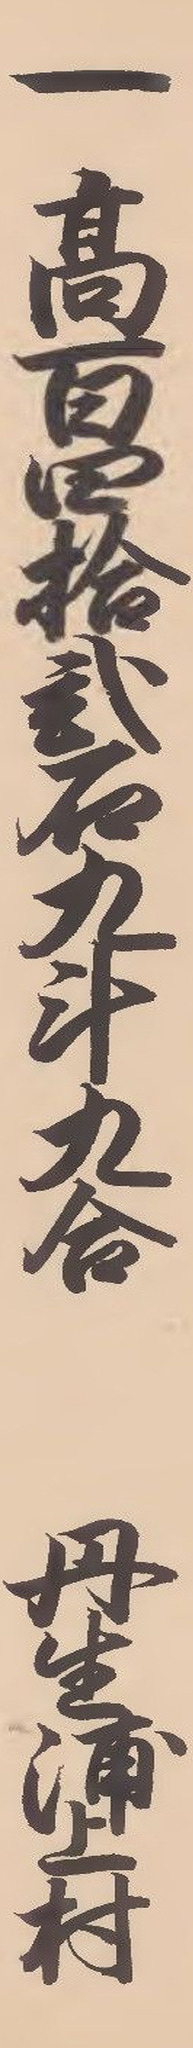一高百四拾弐石九斗九合丹生浦上村
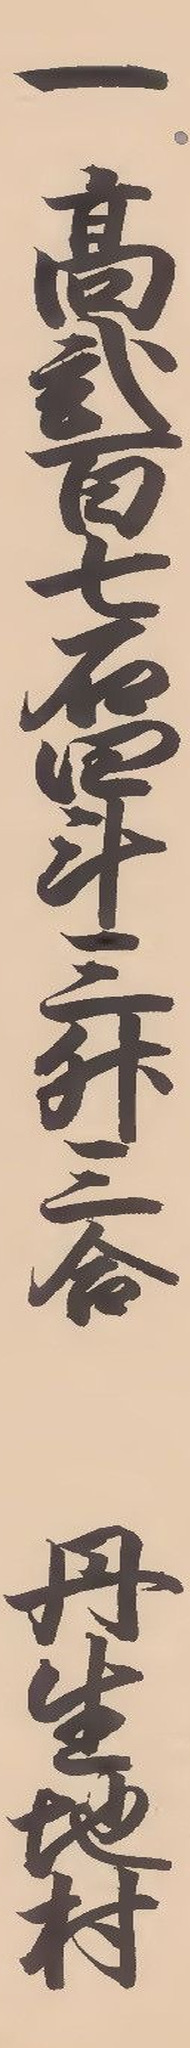一高弐百七石四斗三升三合丹生地村
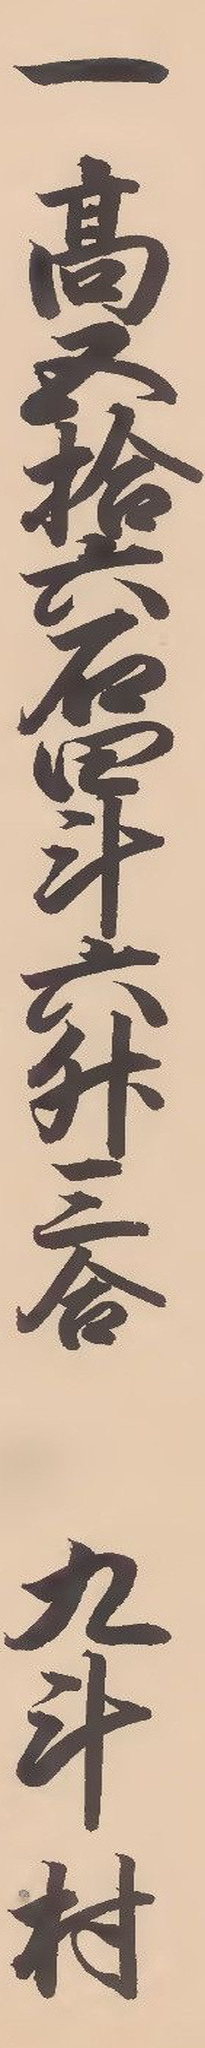一高五拾六石四斗六升三合九斗村
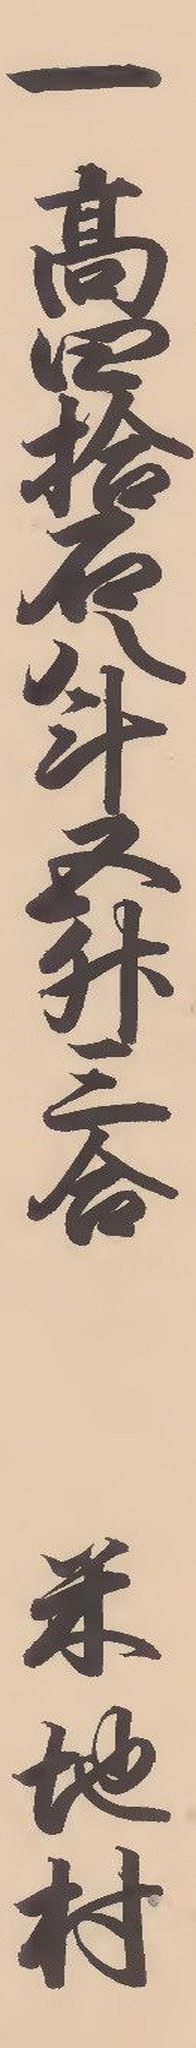一高四拾石八斗五升三合米地村
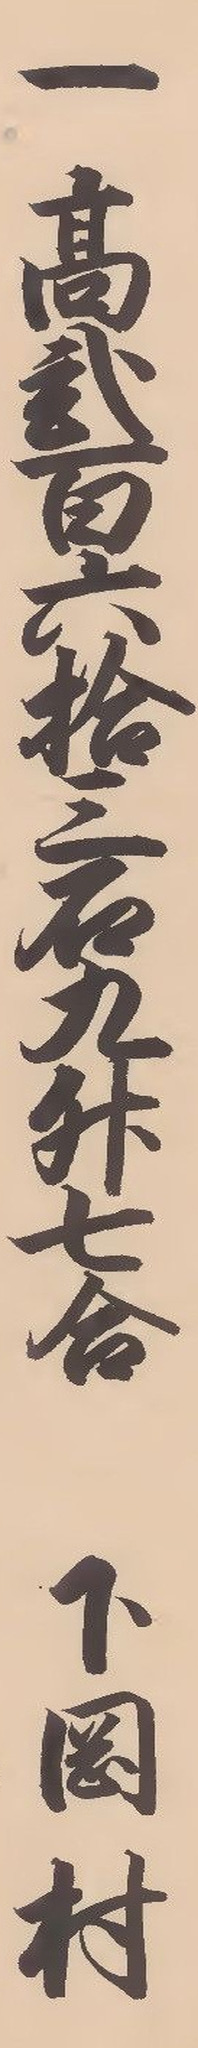一高弐百六拾三石九升七合下岡村
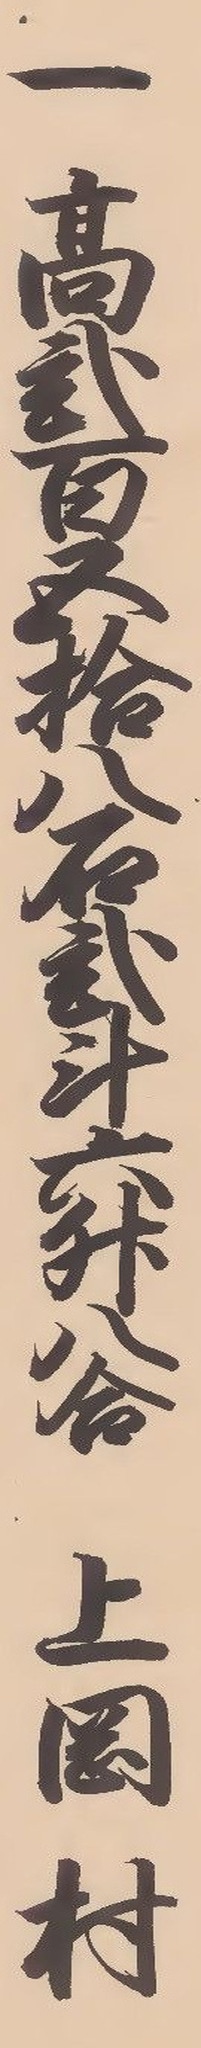一高弐百五拾八石弐斗六升八合上岡村
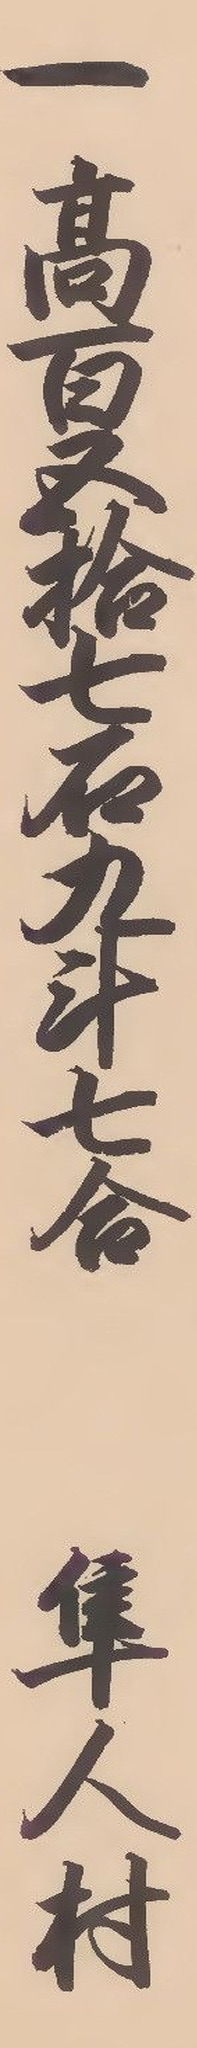一高百五拾七石九斗七合隼人村

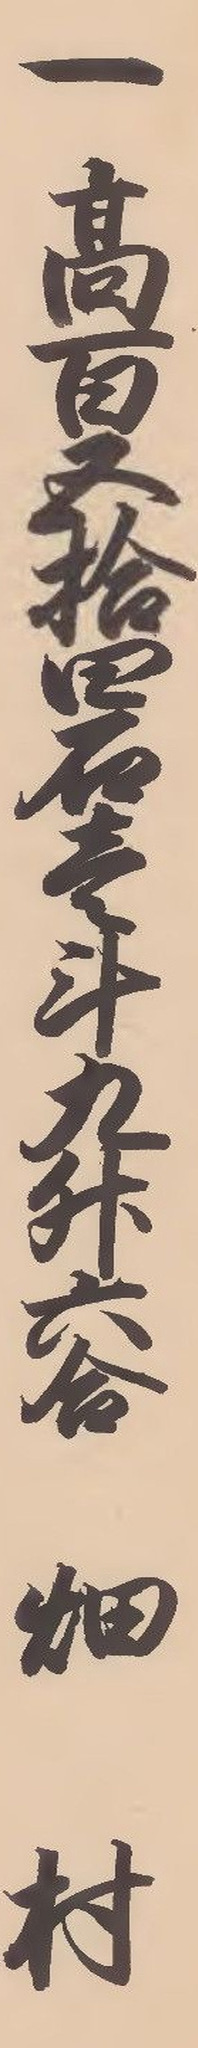一高百五拾四石壱斗九升六合畑村
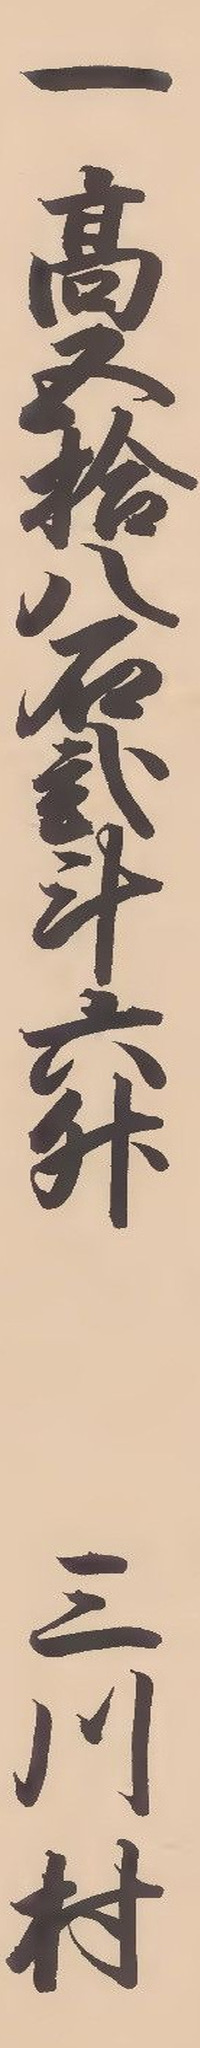一高五拾八石弐斗六升三川村
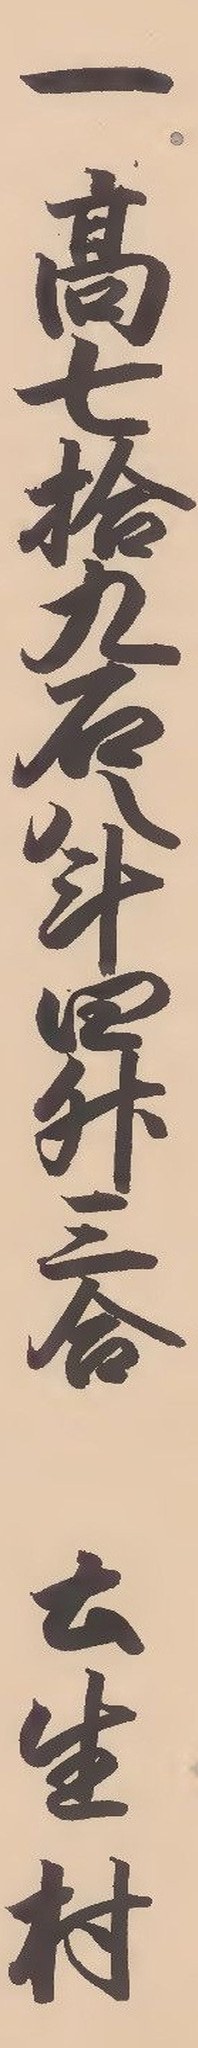一高七拾九石八斗四升三合土生村
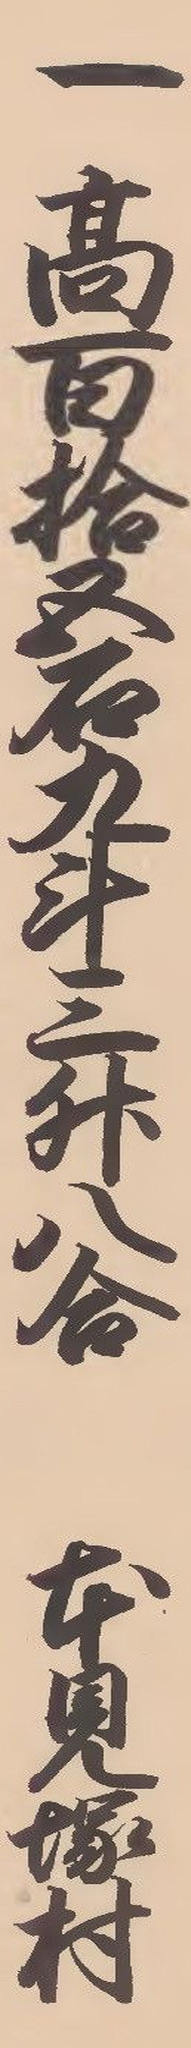一高百拾五石九斗三升八合本見塚村
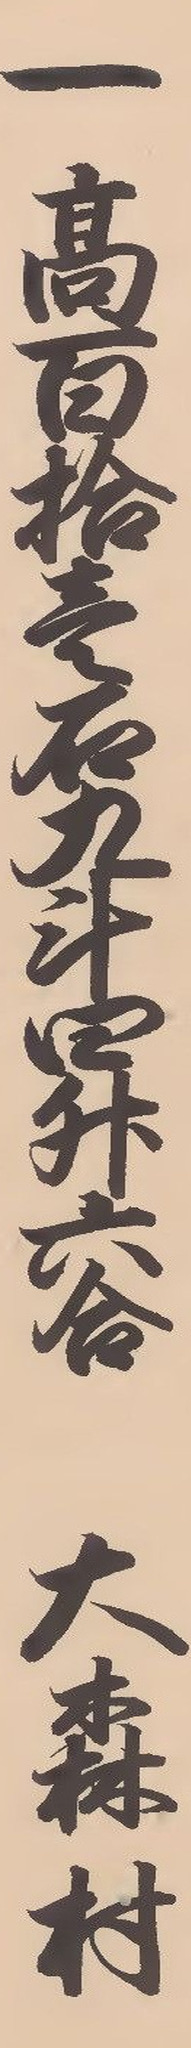一高百拾壱石九斗四升六合大森村
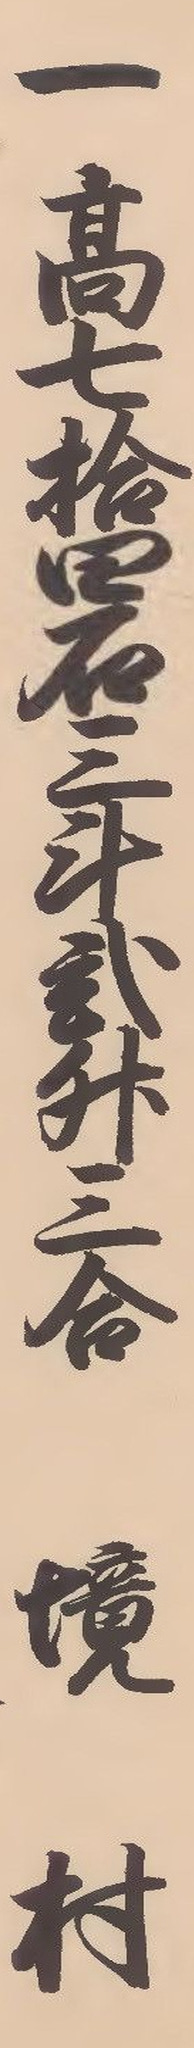一高七拾四石三斗弐升三合境村
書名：但馬国郷帳
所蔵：国立公文書館 National Archives of Japan
